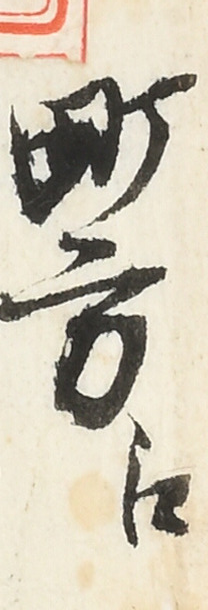町方江
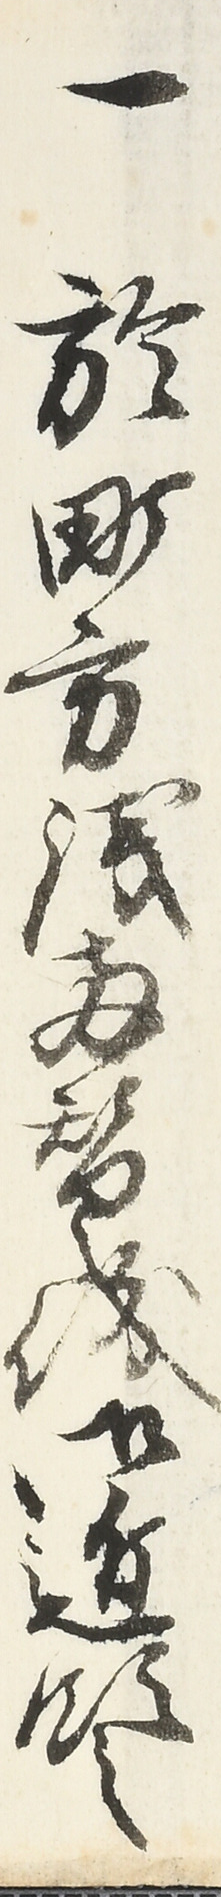一於町方銭両替之儀御近領之
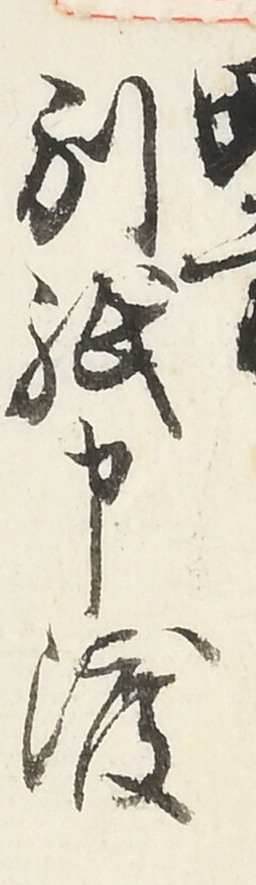別紙申渡
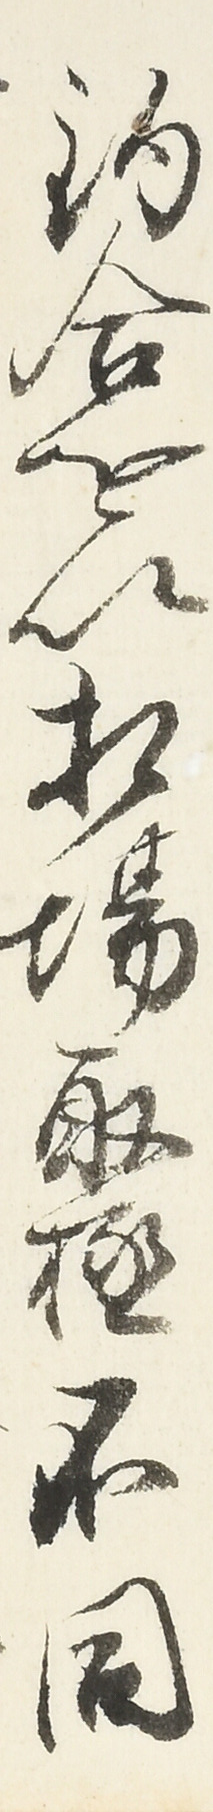釣合を以相場取極不同
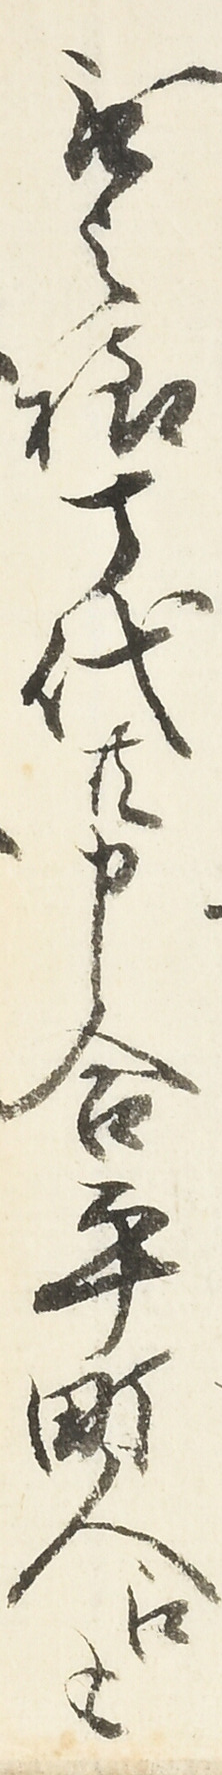無之様丁代共申合平町人江も
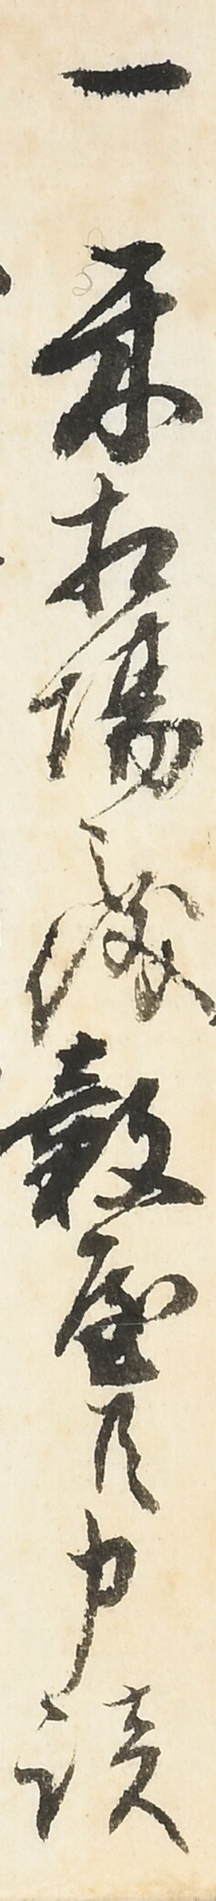一米相場之儀穀屋共申談
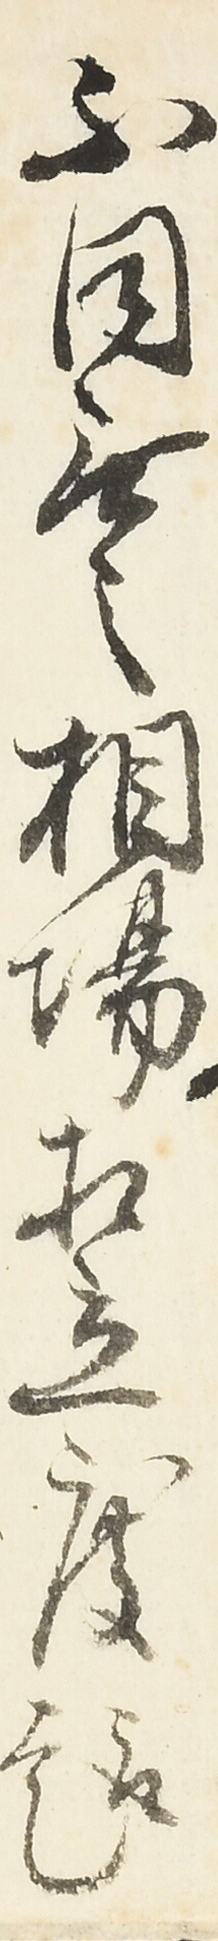不同無之相場相立度趣
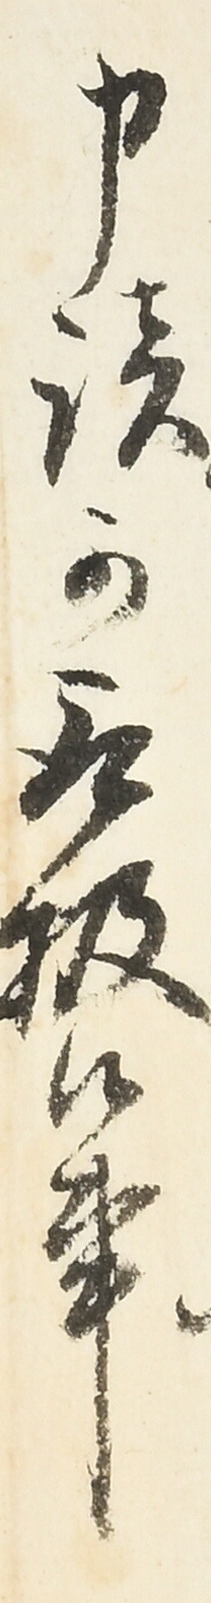申談可取扱候事
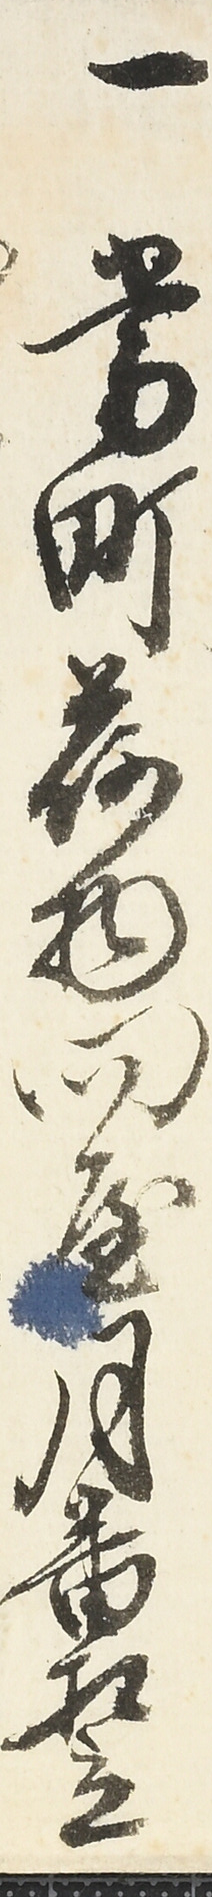一当町荷物問屋月番相立
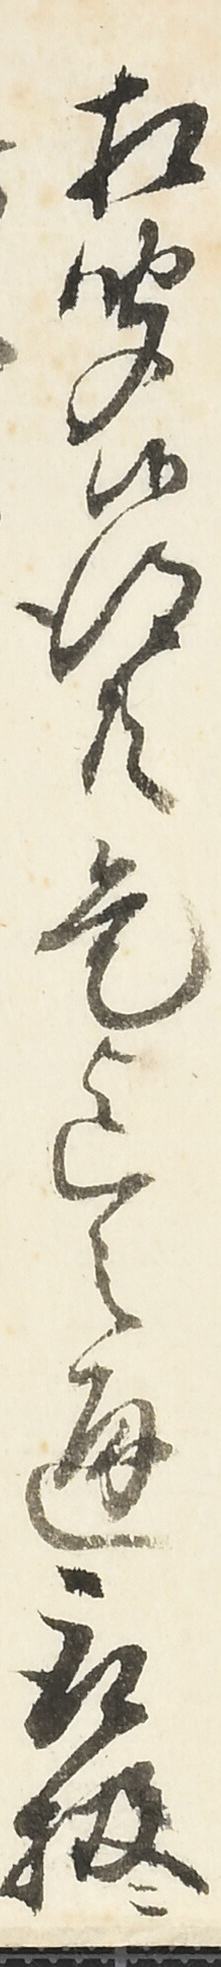相聞候得共是迄之通取扱ニ
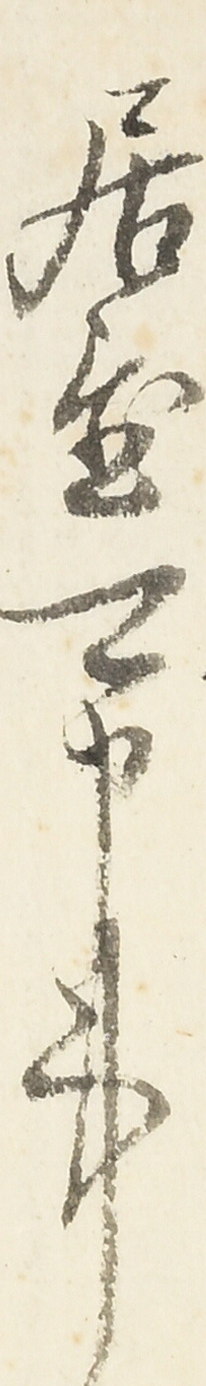居置可申事
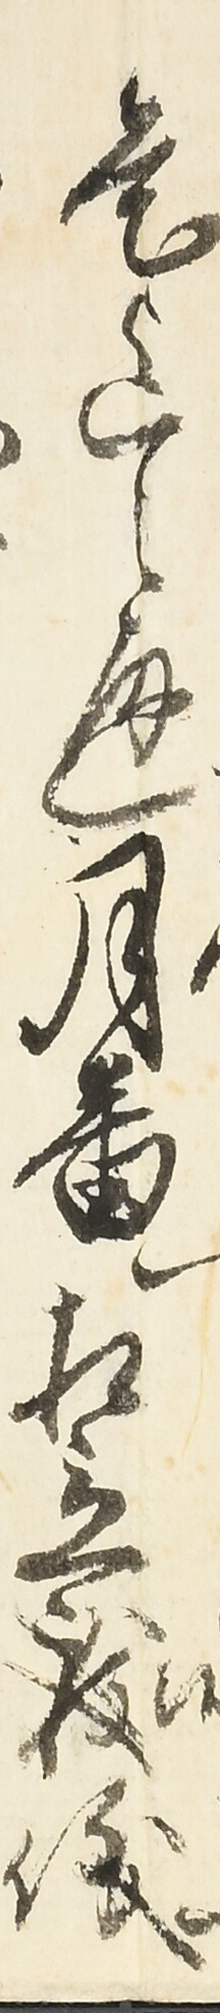是迄之通月番相立候儀
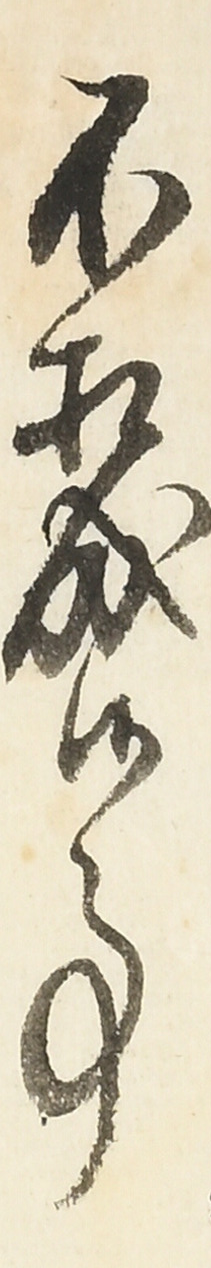不相成候事
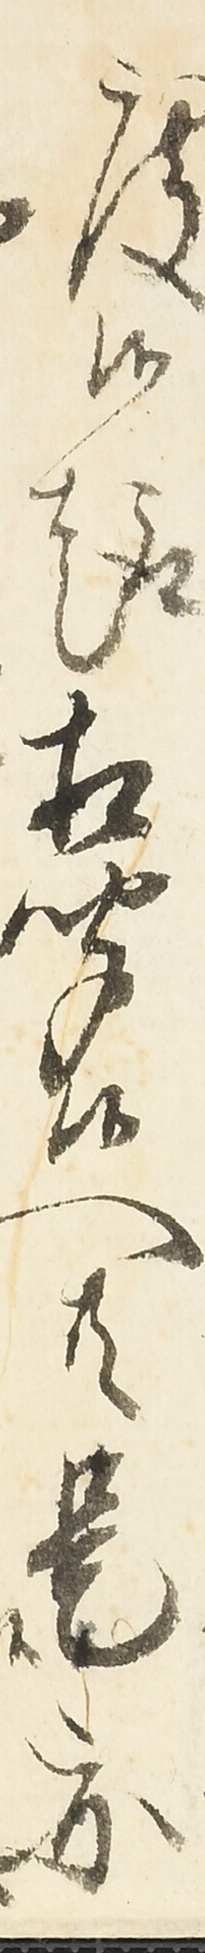度候趣相聞候へ共是亦
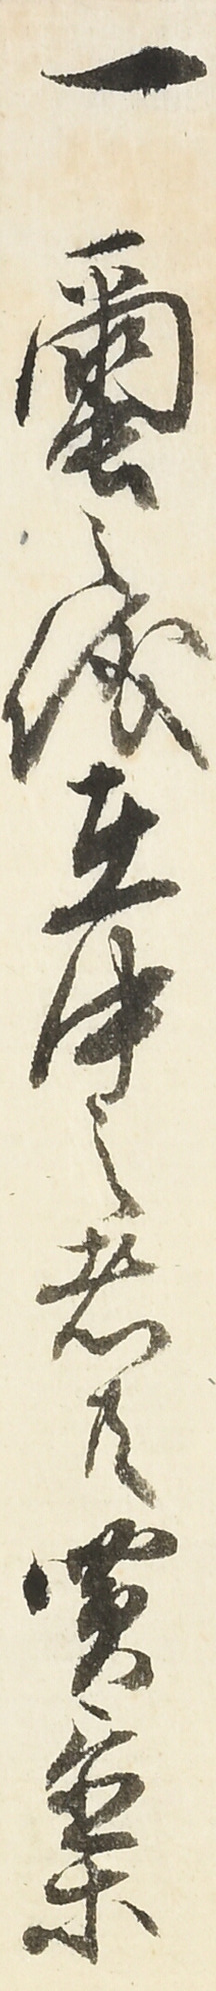一繭之儀在中之者共買置等
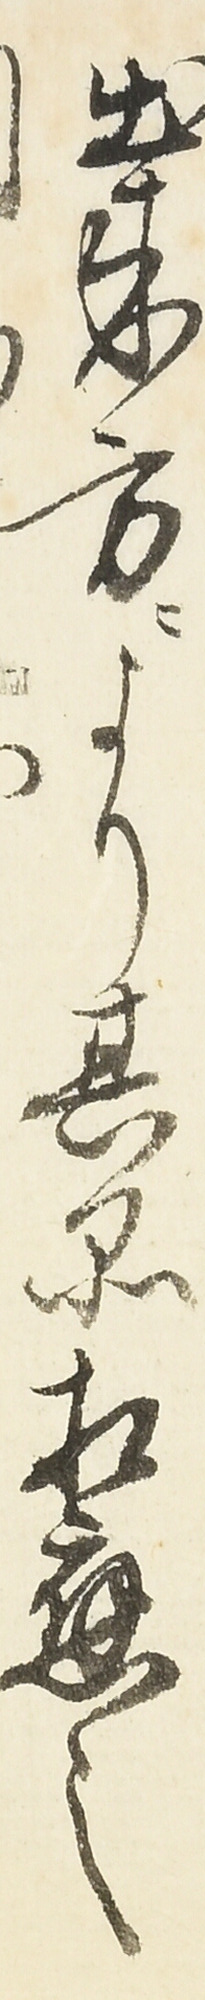出来方ニより其品相応之
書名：町方江別紙申渡
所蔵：伊那市立高遠町図書館・合同会社AMANE
